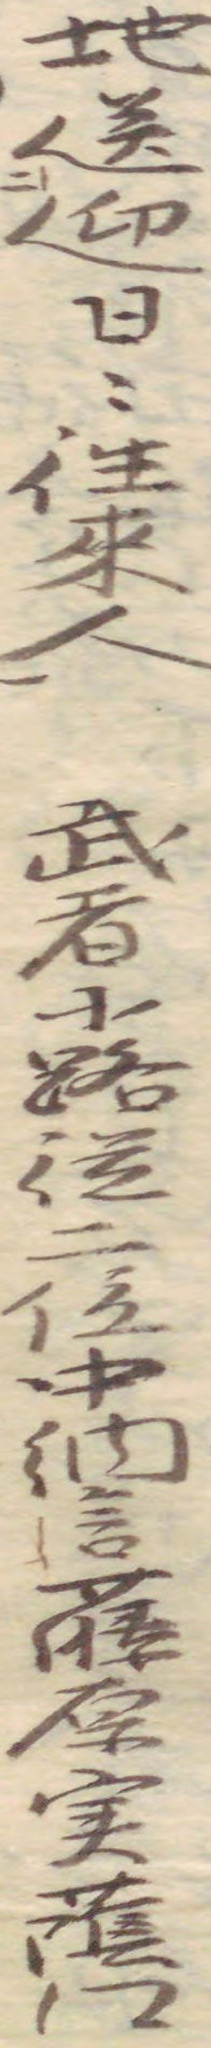地送_迎日〻往来人武者小路従二位中納言藤原実蔭卿
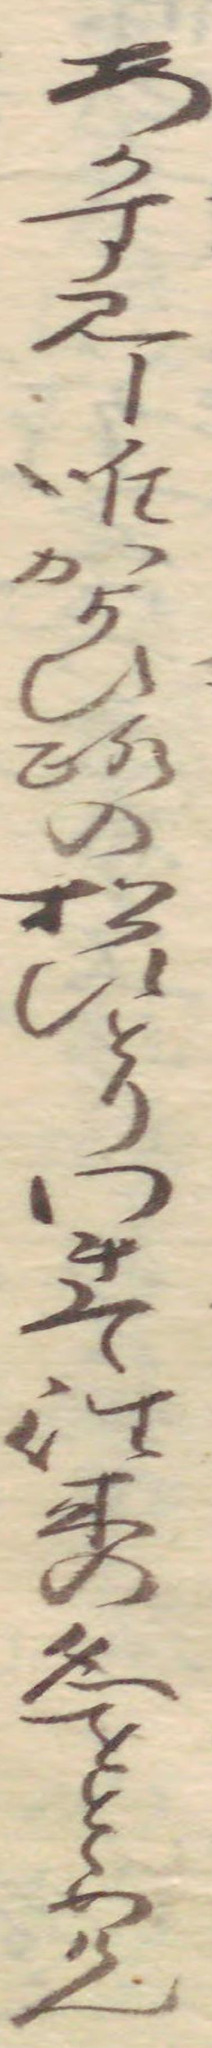あかす見し唯かよひ路の松ひとりわきて往来の名をとゝめけん
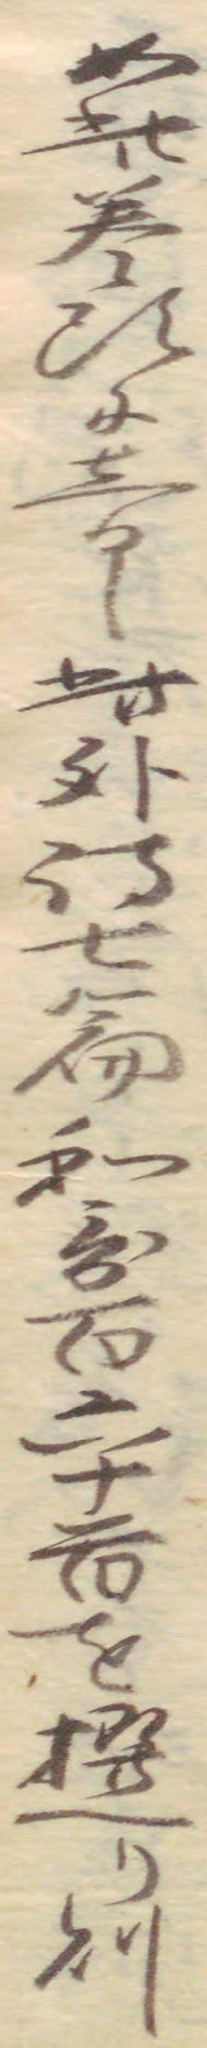如此巻頭にしるし此外詩七篇和歌百六十首を撰へり則

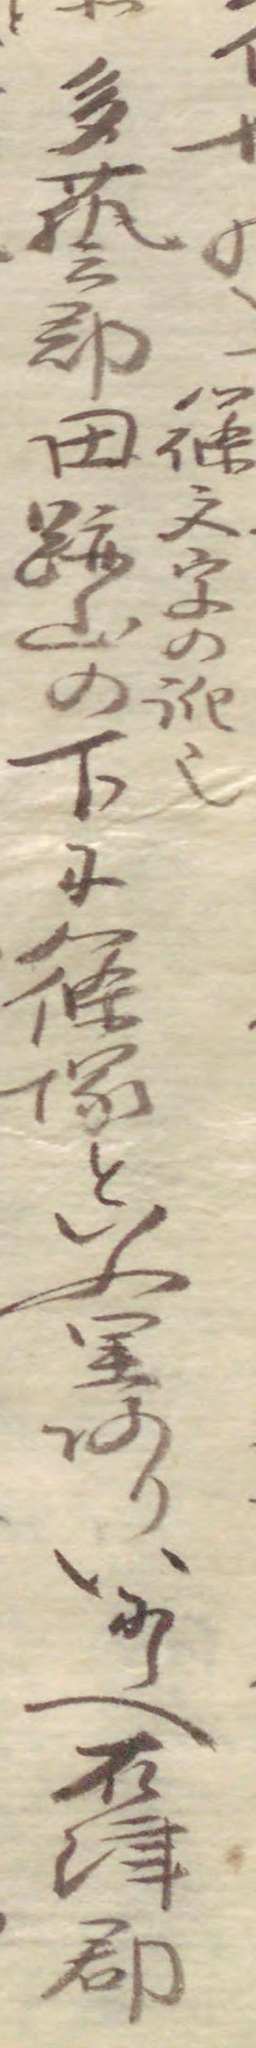多藝郡田跡山の下に篠塚といふ里ありいにしへ石津郡
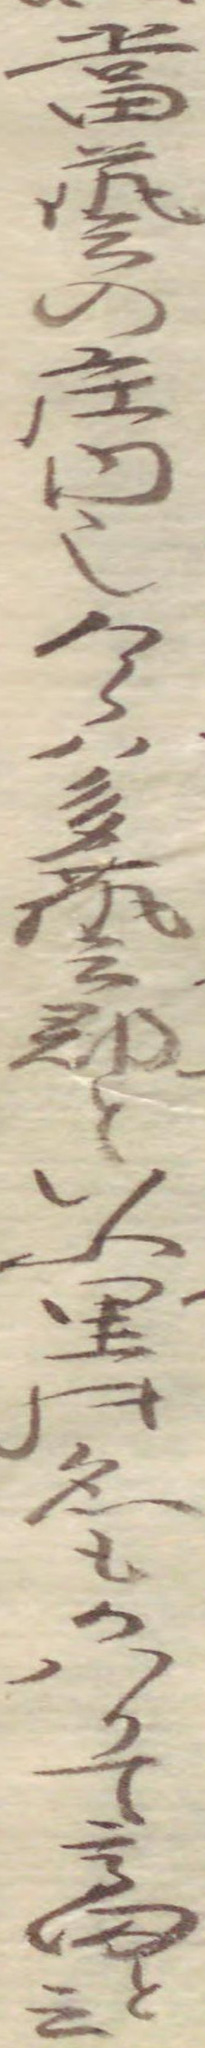當藝の庄内也今は多藝郡といふ里の名もかはりて高田と云
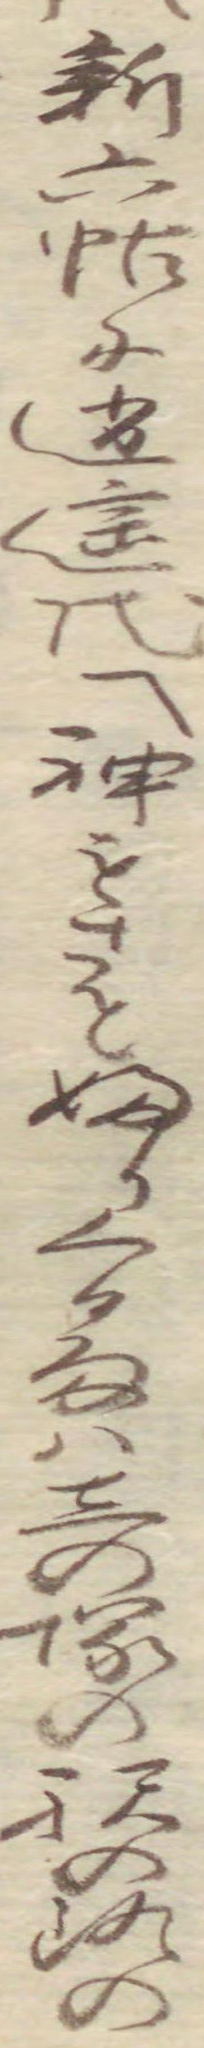新六帖に逍遥院〽神もさそふりくる雨はしの塚の駅の鈴の
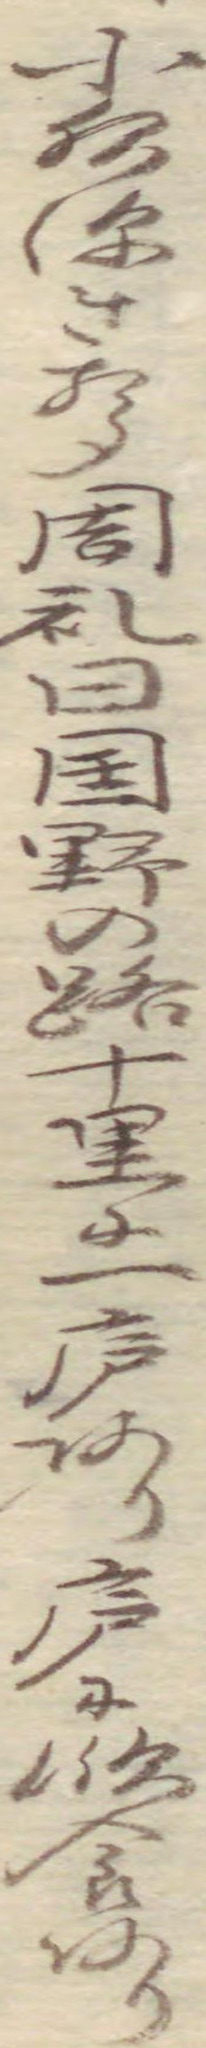小夜深き声周礼曰囯野の路十里に一廬あり廬に飲食あり
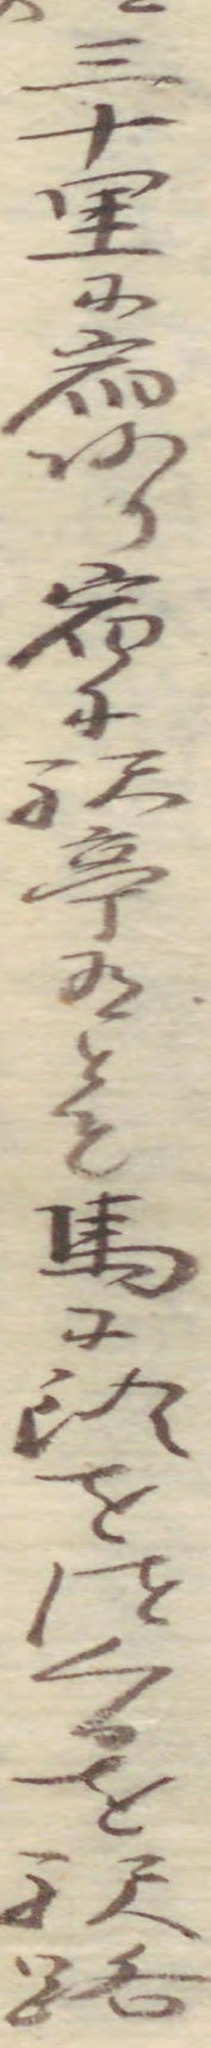三十里に宿あり宿に駅亭有とそ馬に鈴をつくるを駅路
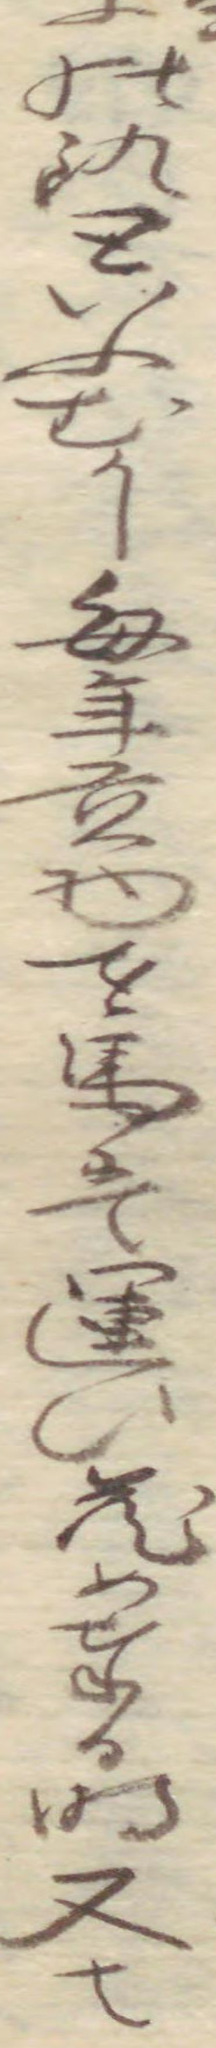の鈴といふむかし毎年貢物を馬にて運ひ蔵め奉る時又は
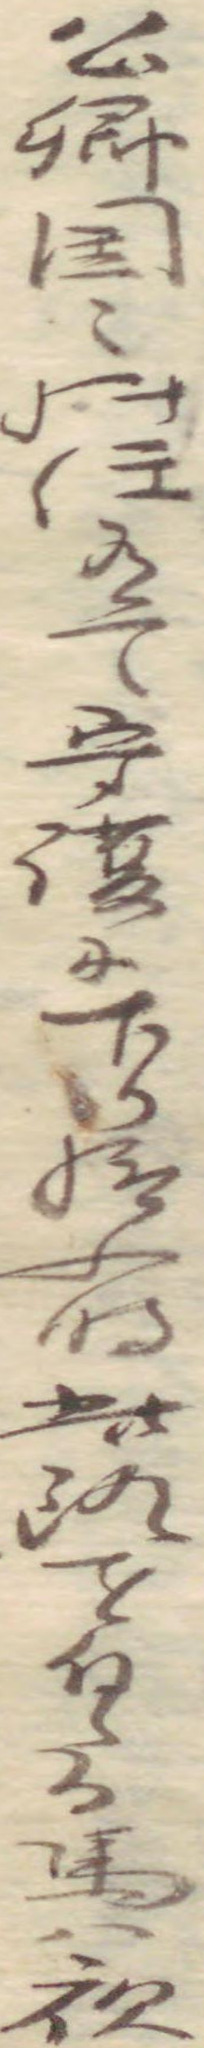公卿国〻の任有て守護に下り給ふ時此鈴を付たる馬は夜
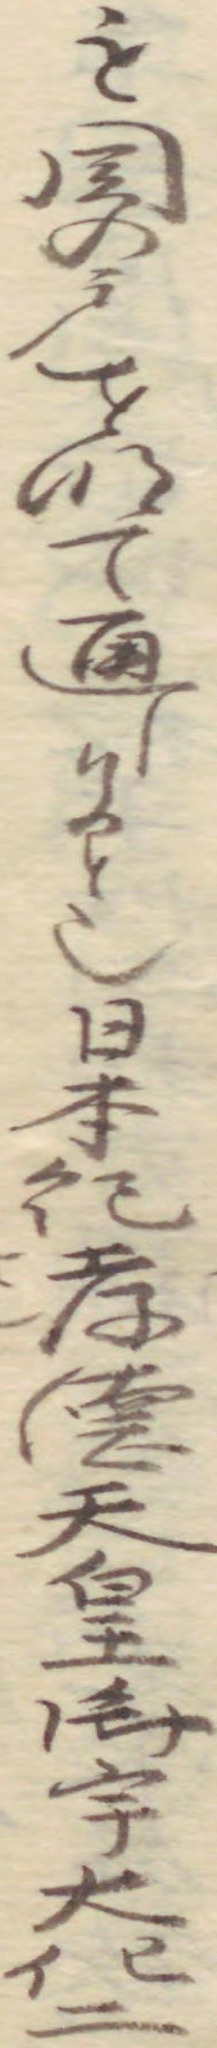も関の戸を明て通しけると也日本記孝徳天皇御宇大化二
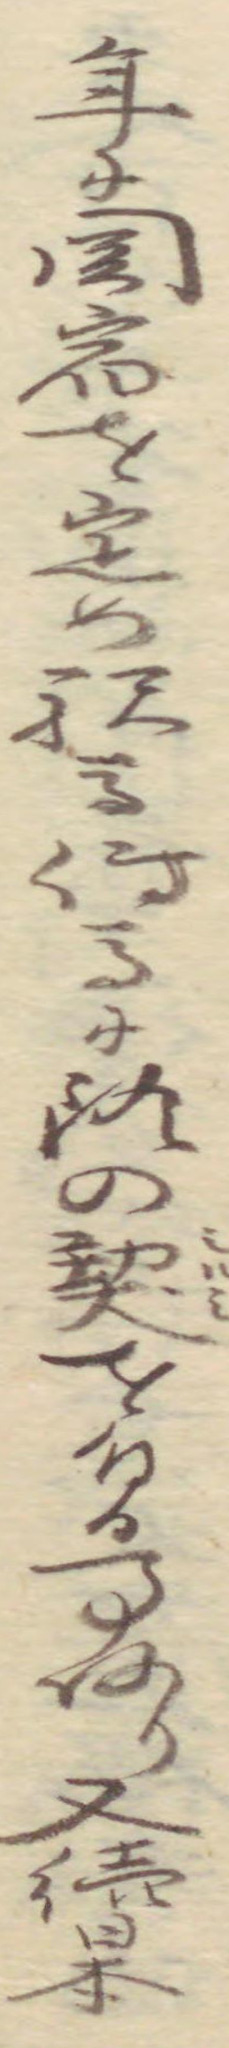年に関宿を定め駅馬伝馬に鈴の契を付る事あり又続日本
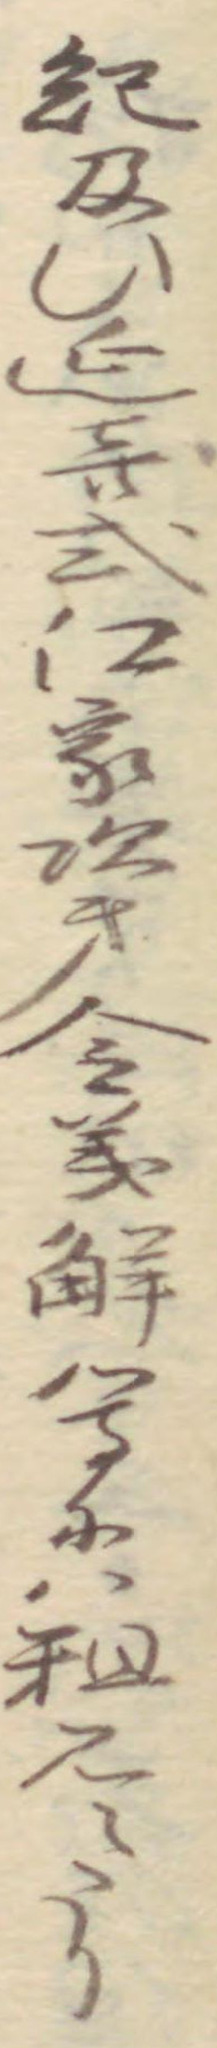記及ひ延喜式江家次第令義解等には粗見えたり
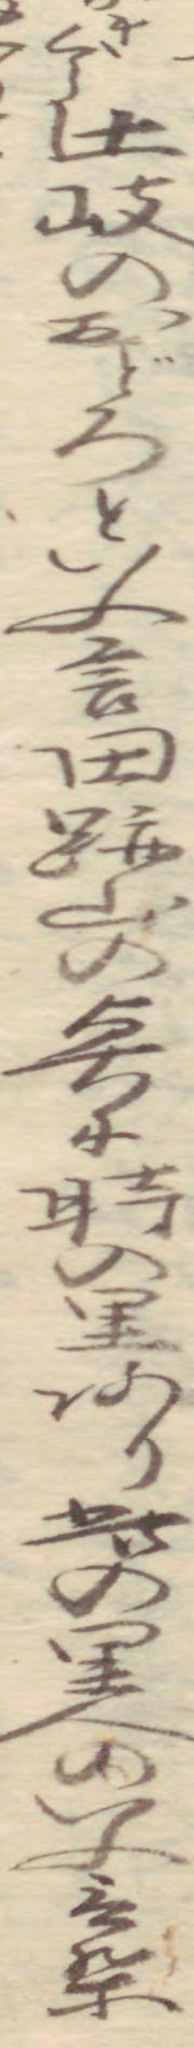土岐のおどろといふ言田跡山の奥に時の里あり此里人のいふ言葉
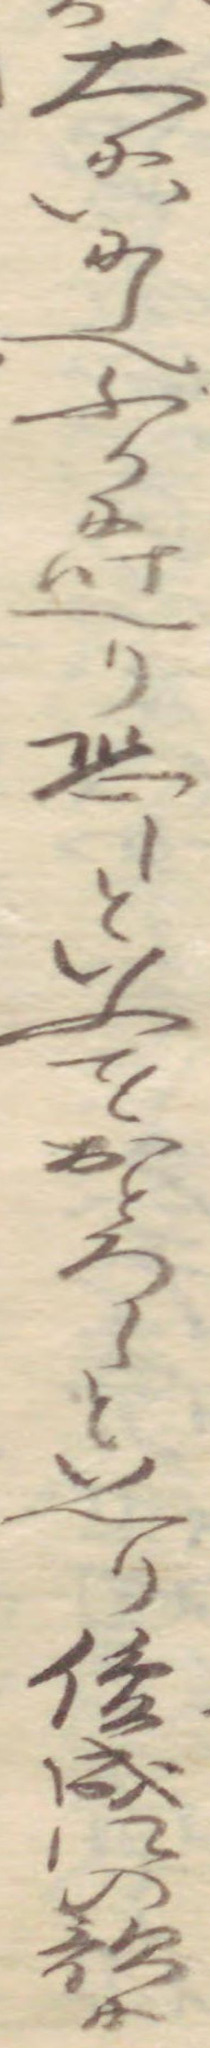大にいにしへぶりに叶へり恐しといふをおとろしといへり俊成卿の歌に
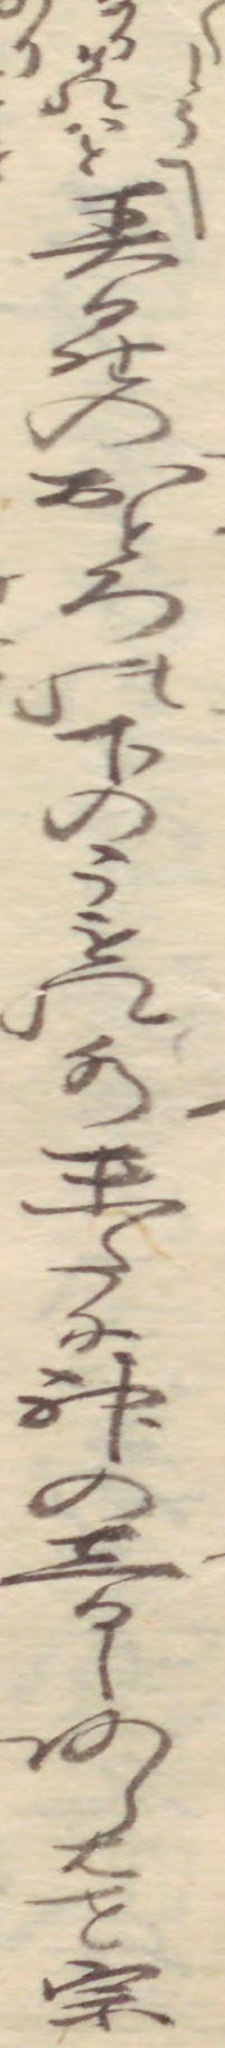〽春日野のおとろの下のうもれ水末たに神のしるしあらはせ宗
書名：鶯宿雑記. 巻263-264
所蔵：国立国会図書館 National Diet Library, JAPAN
